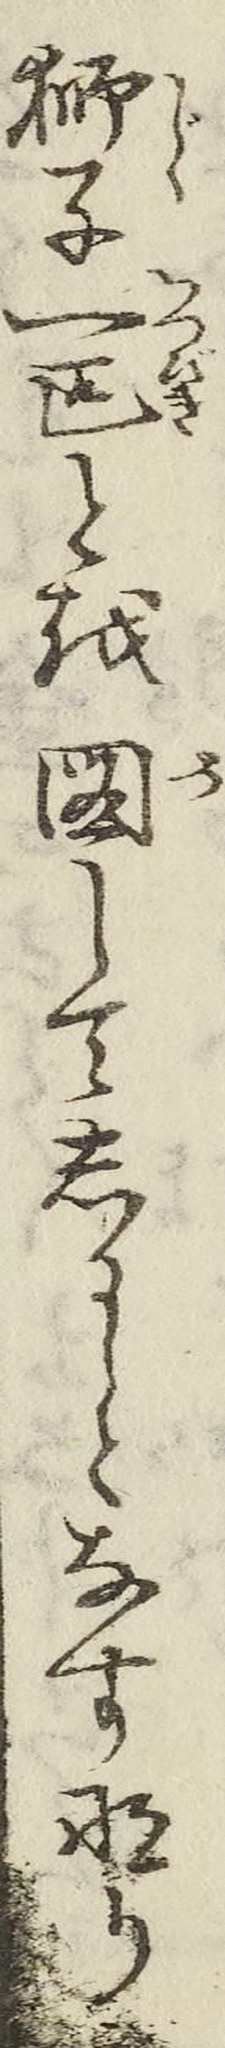獅子一匹とを図してしるしとなすなり
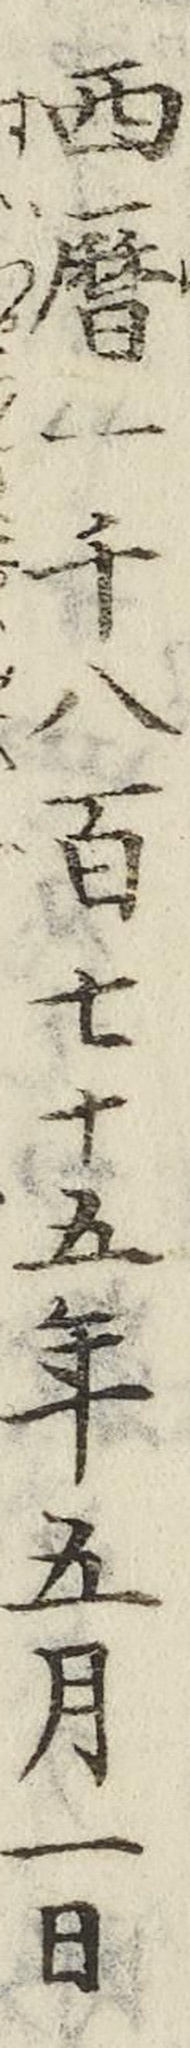西暦一千八百七十五年五月一日
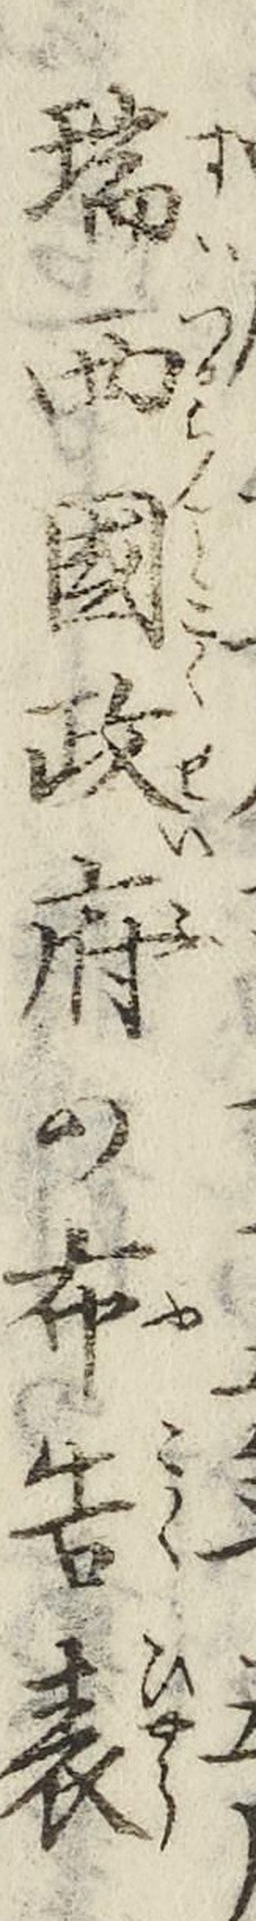瑞西国政府の布告表
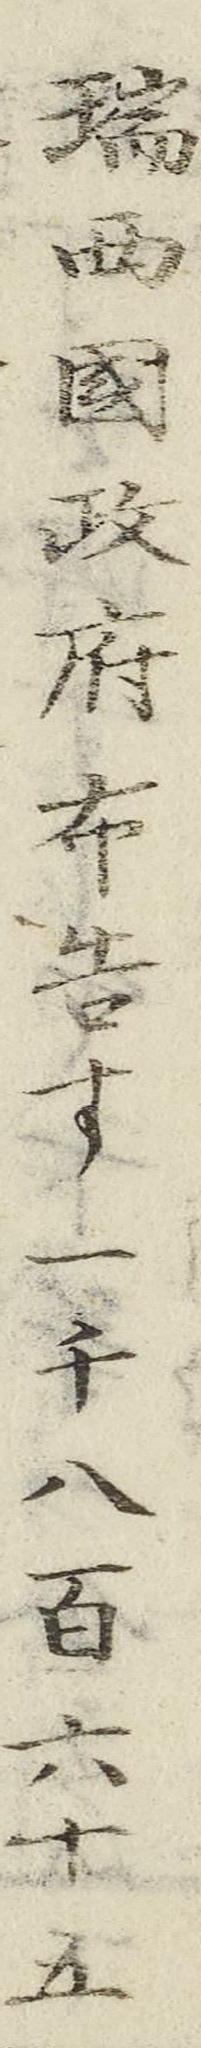瑞西国政府布告す一千八百六十五
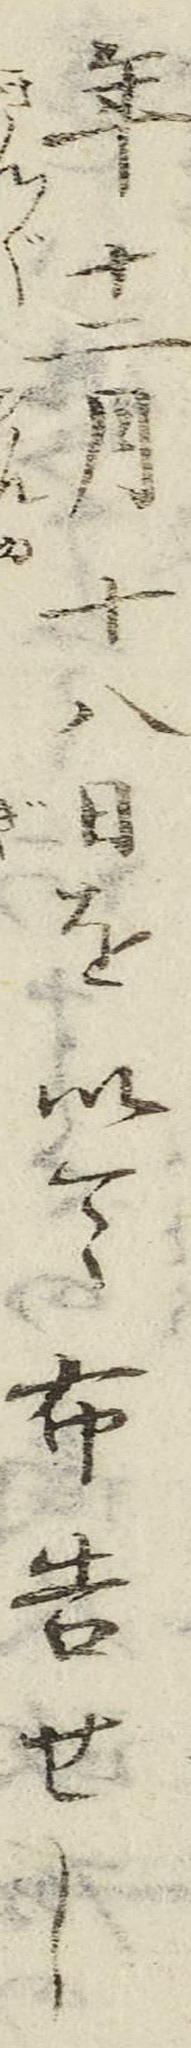年十二月十八日を以て布告せし
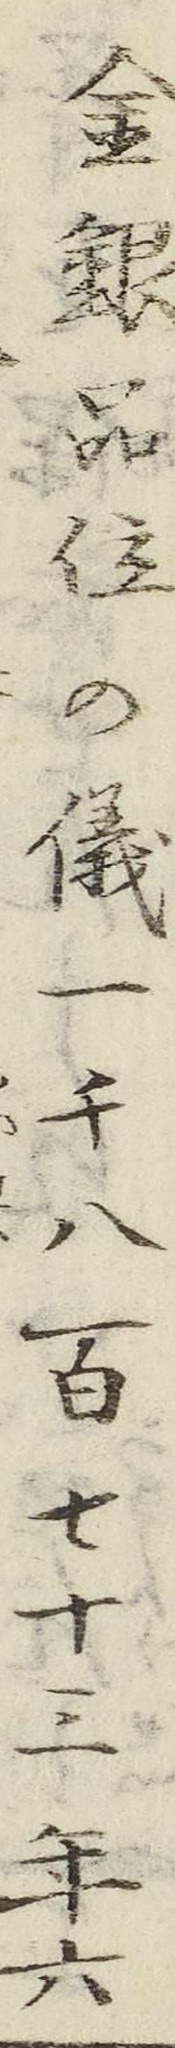金銀品位の儀一千八百七十三年六
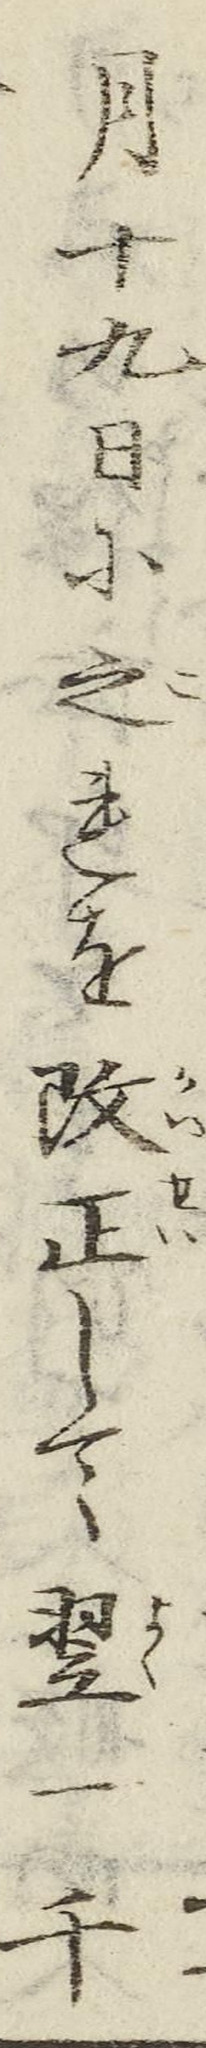月十九日に之れを改正して翌一千
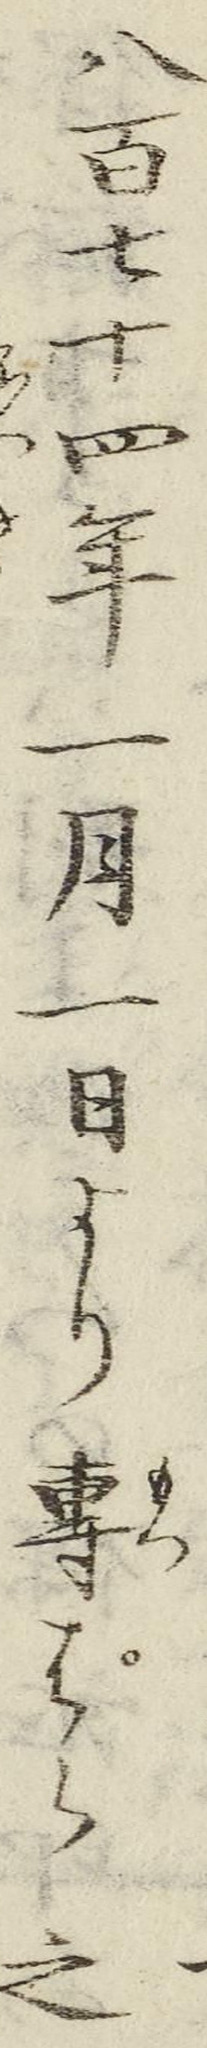八百七十四年一月一日より専ぱら之
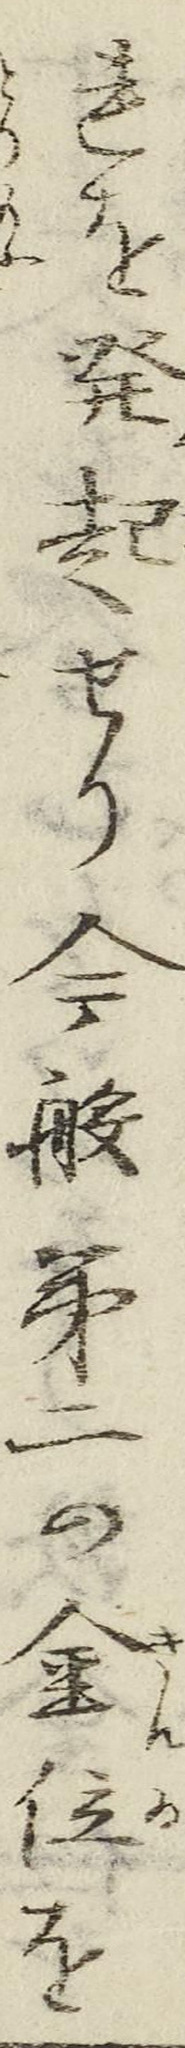れを発起せり今般第二の金位を
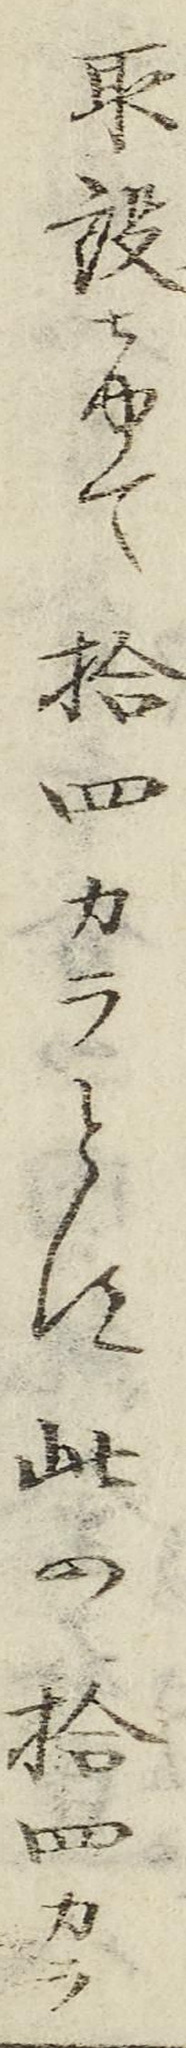取設けて拾四カラとす此の拾四カラ

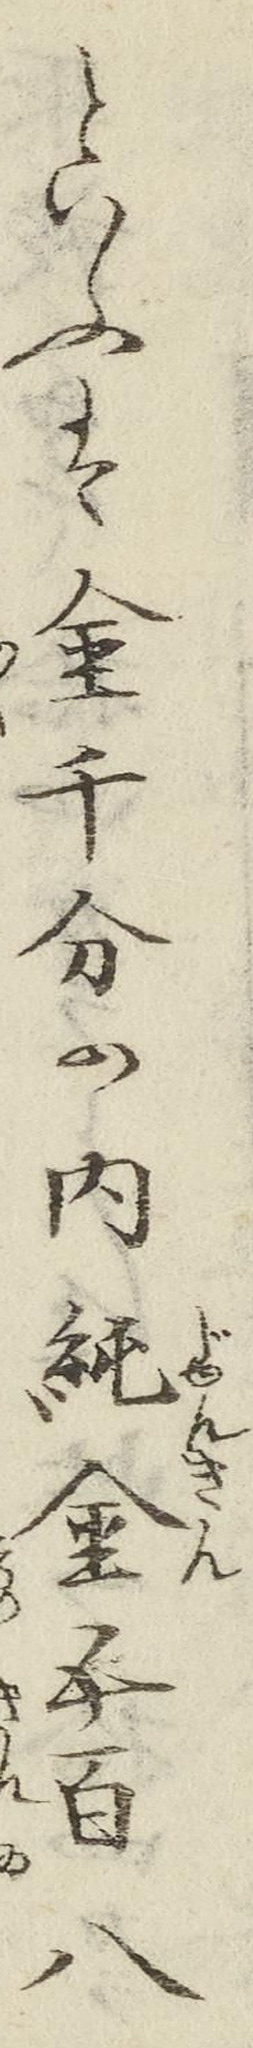といふは金千分の内純金千百八
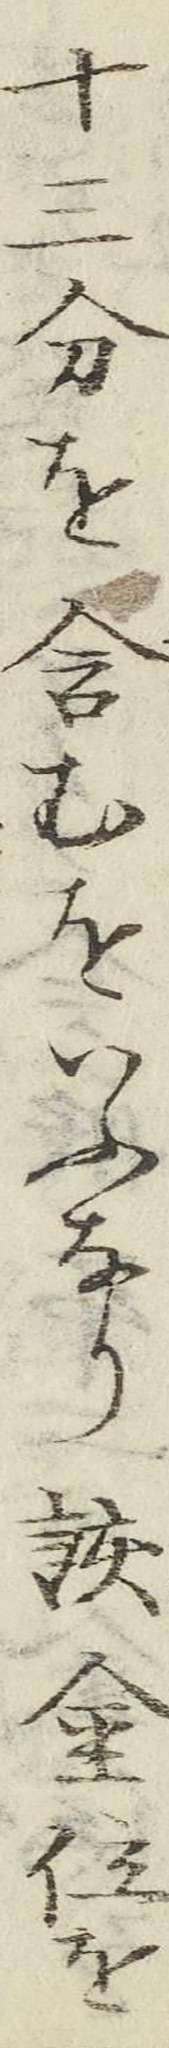十三分を含むをいふなり該金位を
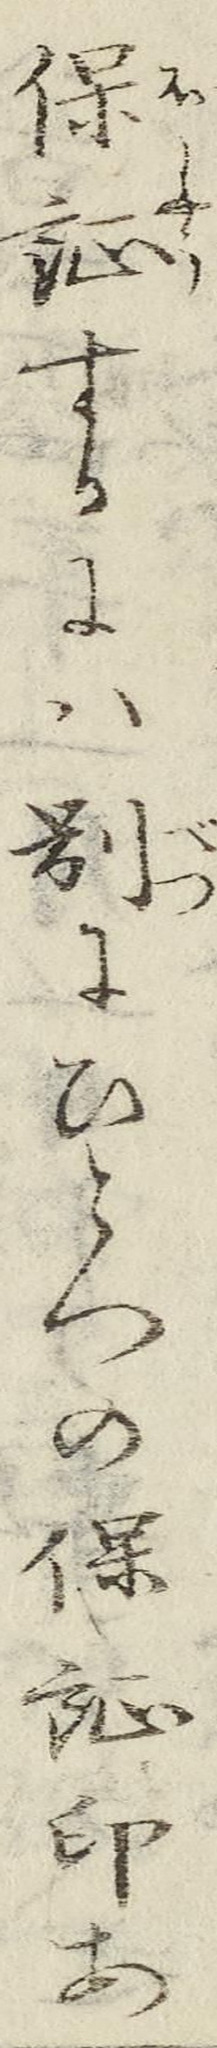保証するには別にひとつの保証印あ
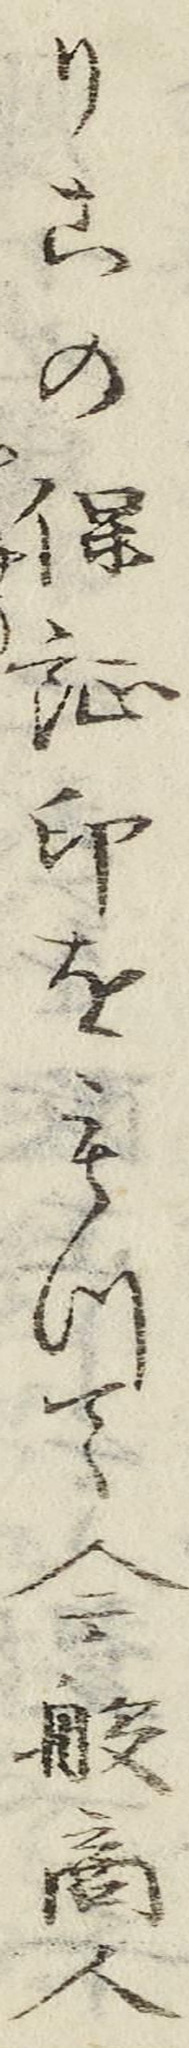りこの保証印をもつて今般商人
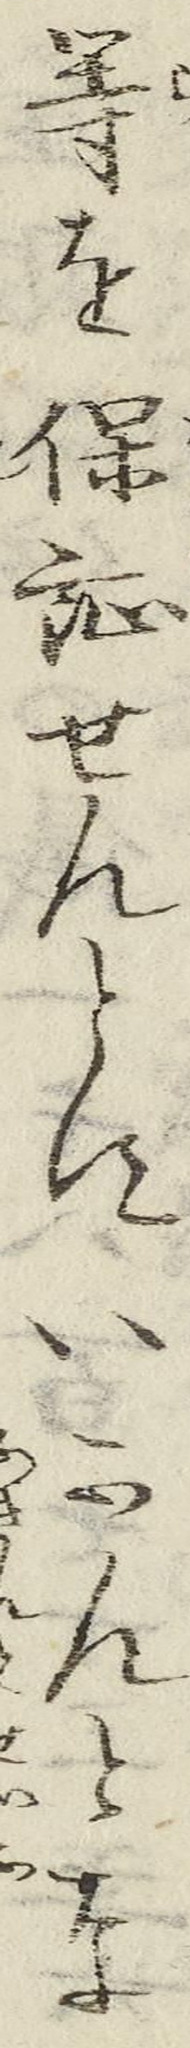等を保証せんとすいかんとな
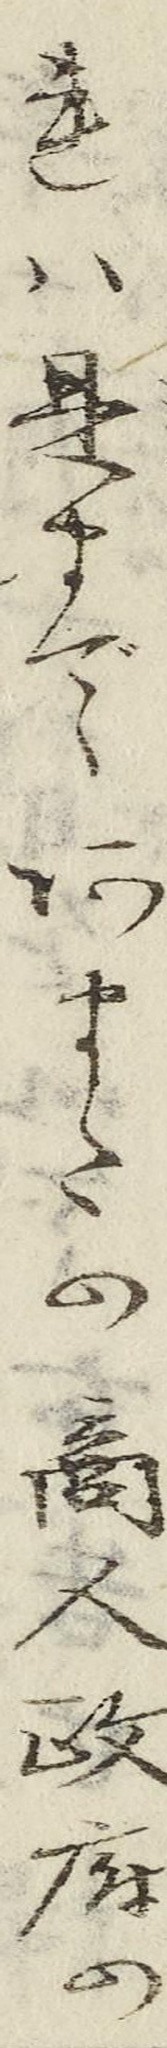れは是まであまたの商人政府の
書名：[時計に関する冊子]
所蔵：東京大学地震研究所図書室 Earthquake Research Institute Library, The University of Tokyo, JAPAN
